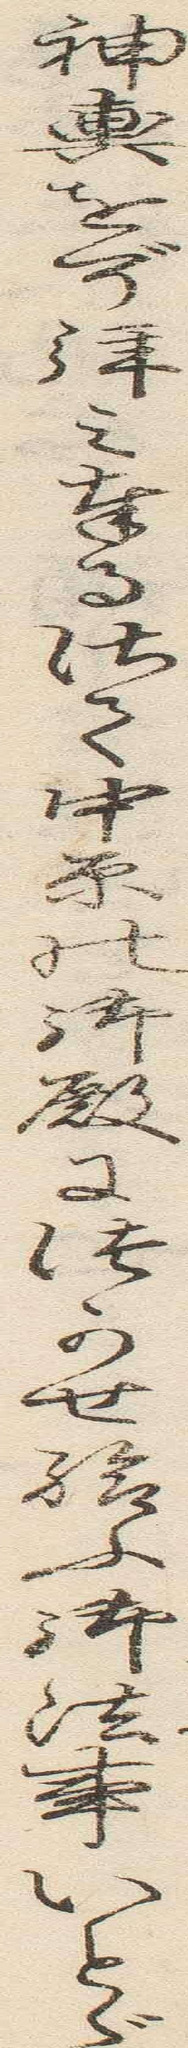神輿をぞ拝み奉るさて中原の御殿につかせ給ふ御法事いとゞ
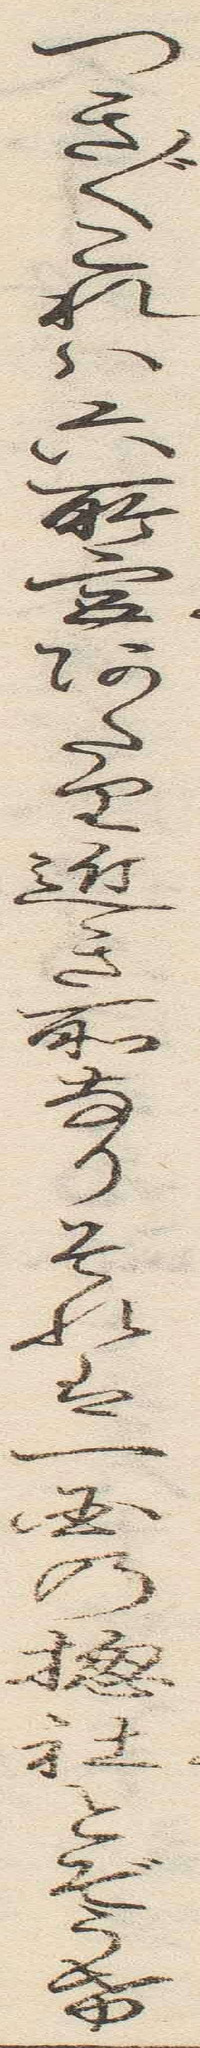つき〴〵これは六所宮あたり近き所それは一国の揔社とぞうけ
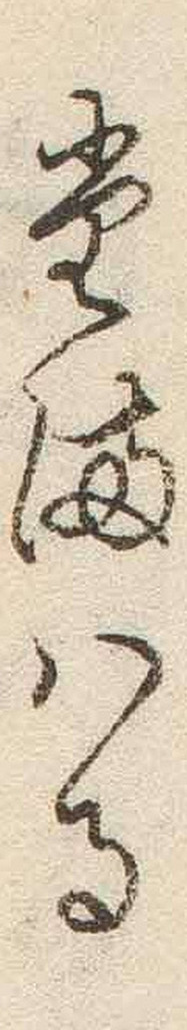たまはる
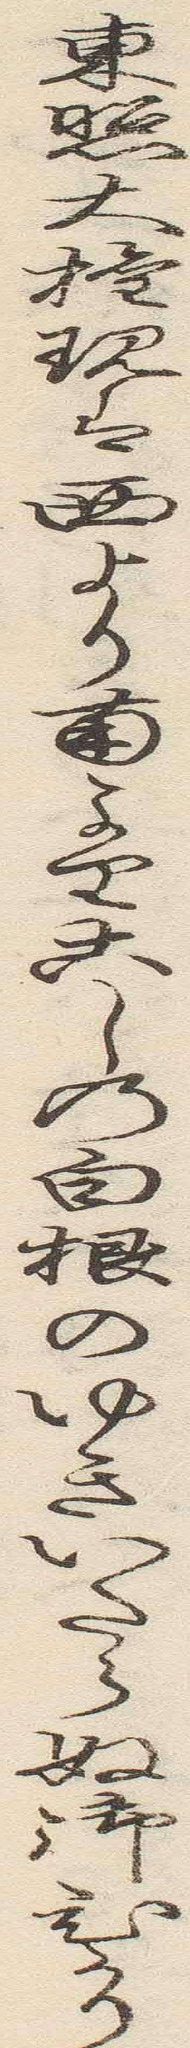東照大權現は西より南よりこしの白根のゆきいたらぬ御ひかり
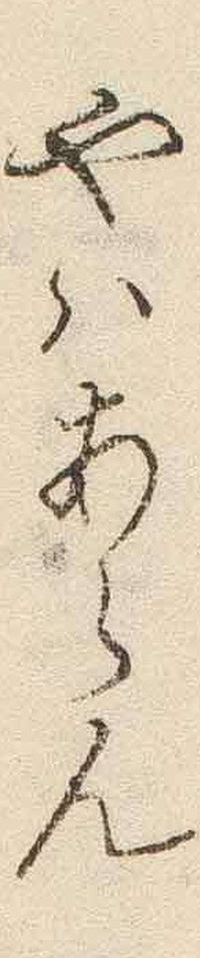やはあらん
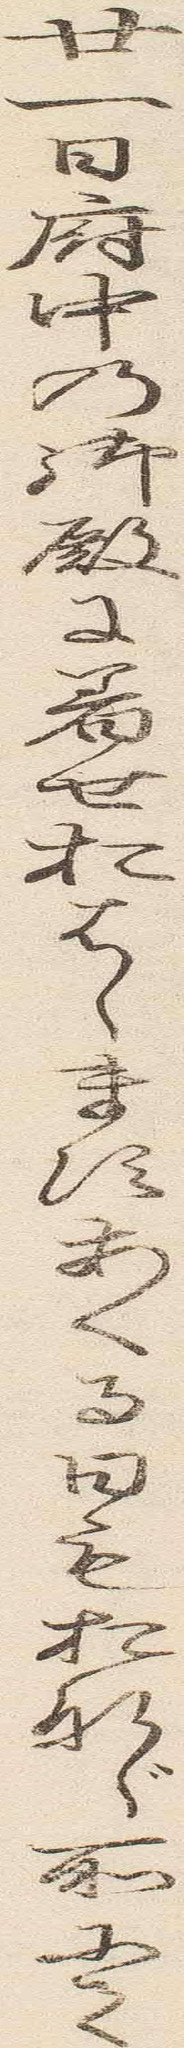廿一日府中の御殿に着せおはしますあくる日もおなじ所にて
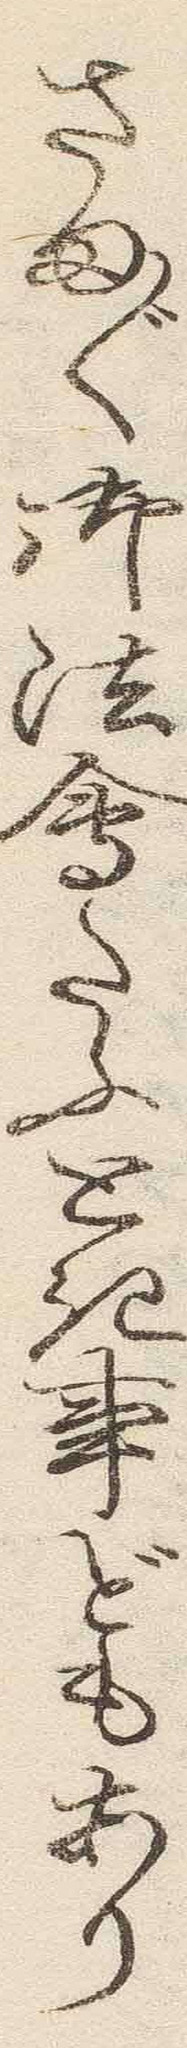さま〴〵御法會たふとき事どもあり
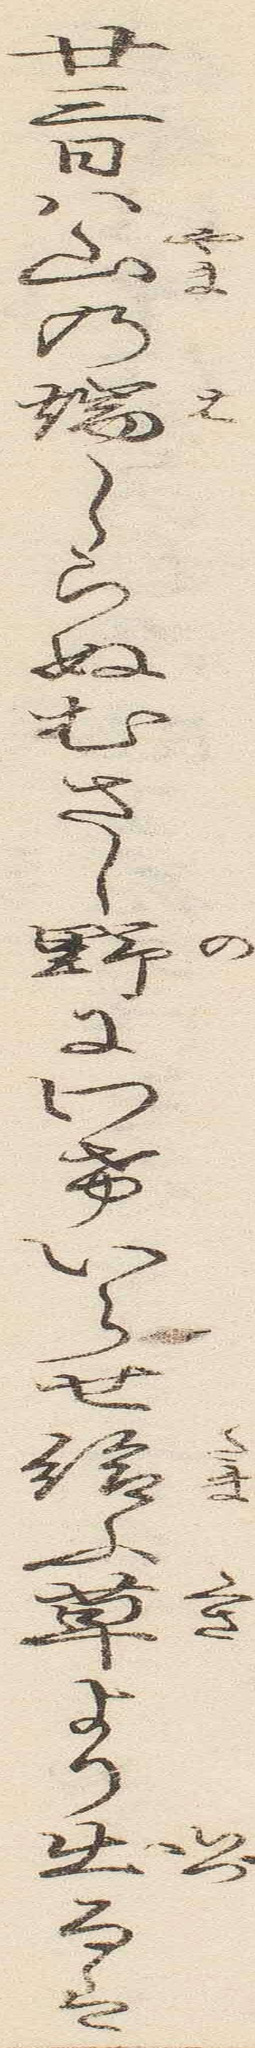廿三日は山の端しらぬむさし野にわけいらせ給ふ草より出るは
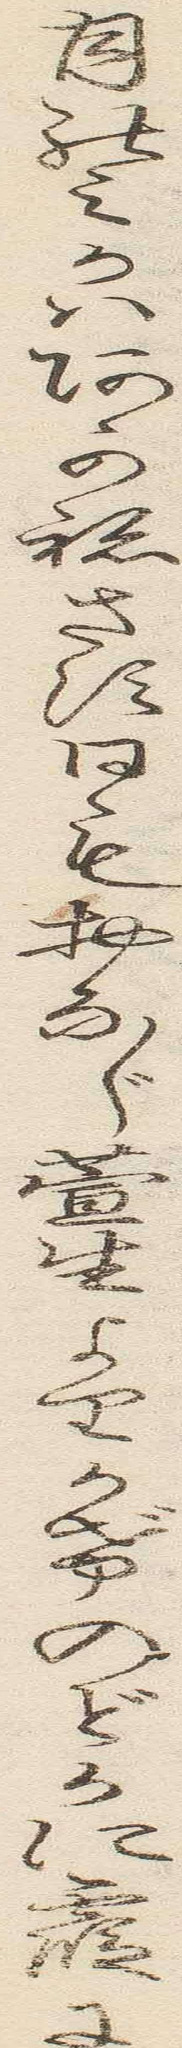月のみかはあのねさす日もおなじ萱生よりかげのどかに霞に
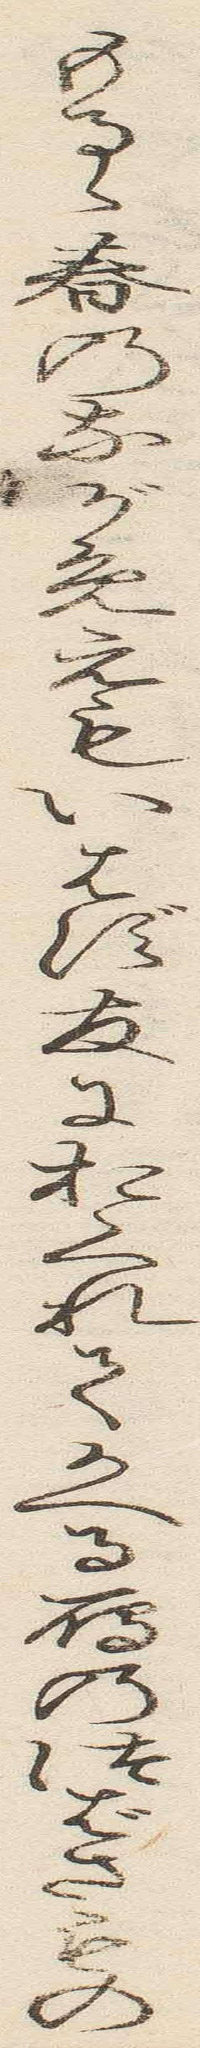もるゝ春もながめえもいはず友におくれてかへる鴈のつばさもの
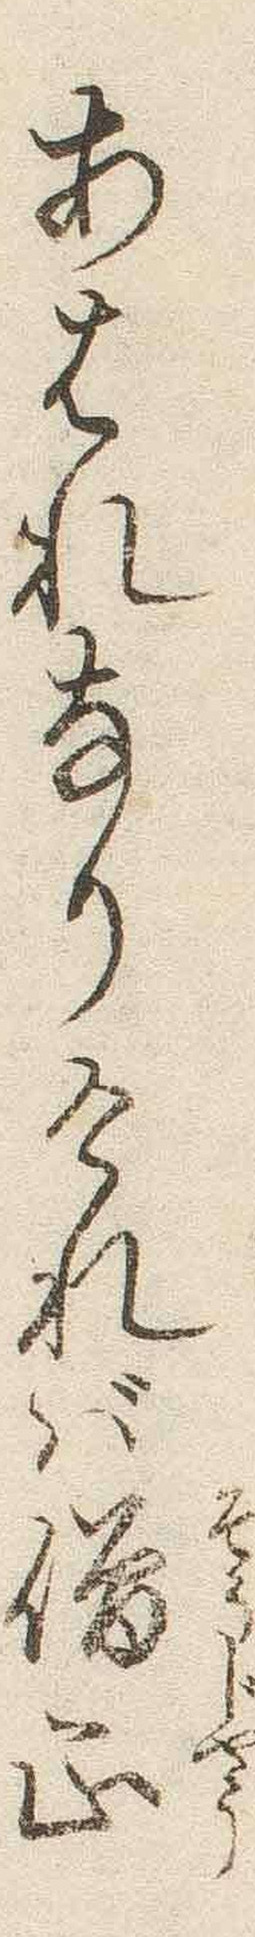あはれなりければ僧正
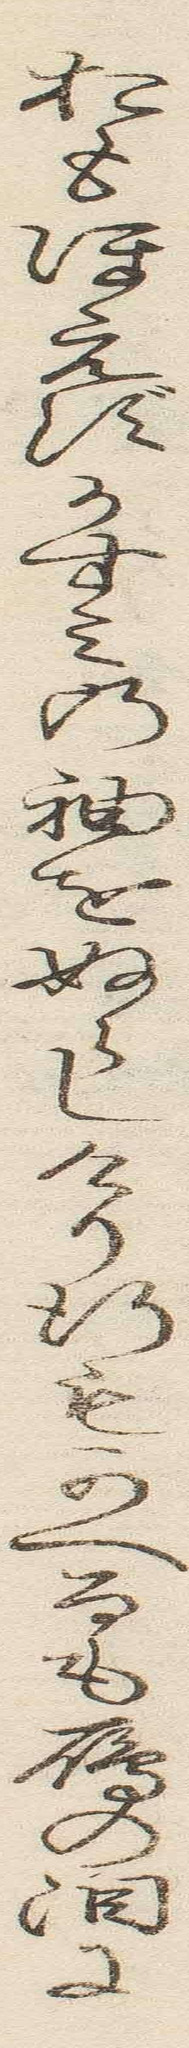おもほえずうすみの袖をぬらしけり行もかへるも鴈の泪に
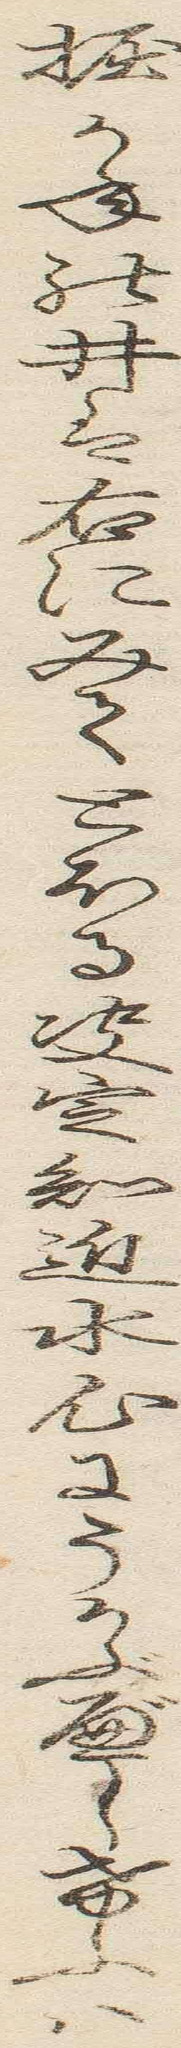掘かねの井は右にみてとほる決定知近水心にうかぶべしけふは
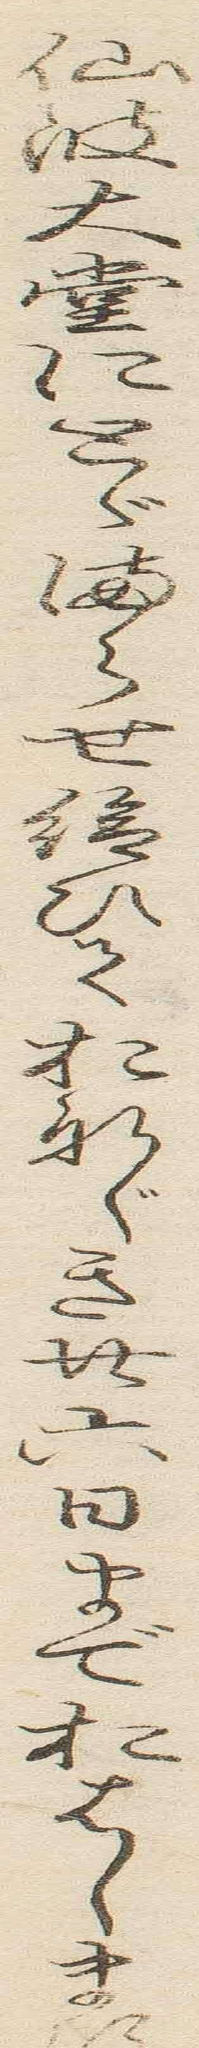仙波大堂にとゞまらせ給ひておなじき廿六日までおはします
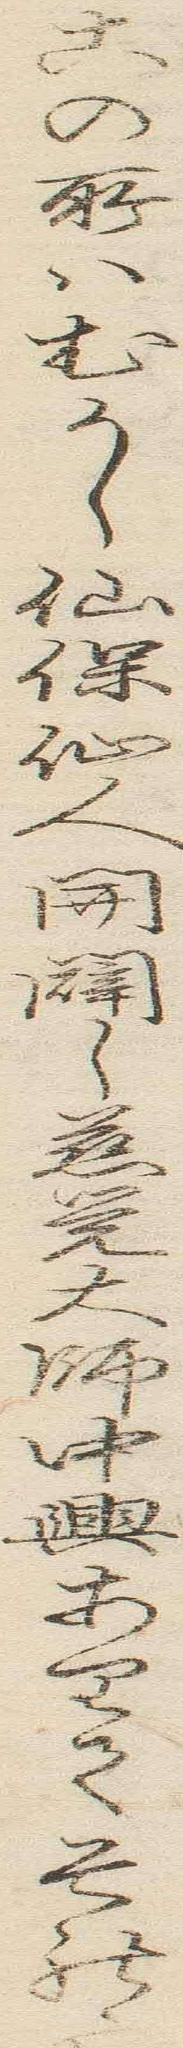この所はむかし仙保仙人開闢し慈覚大師中興ありてそのゝち
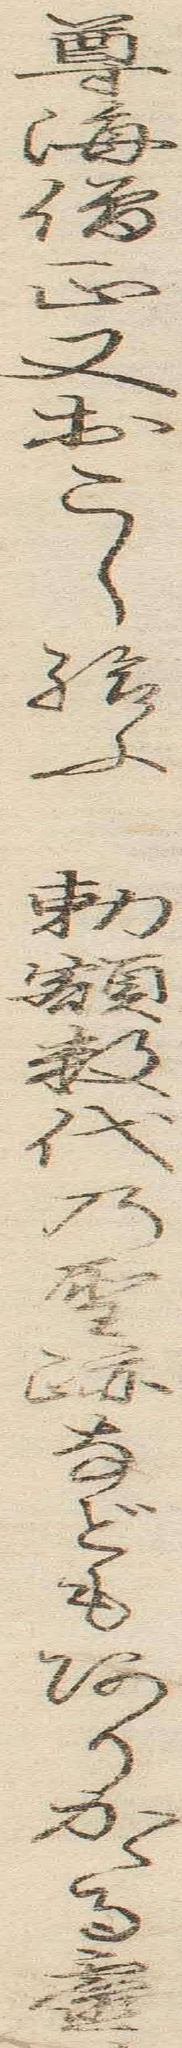尊海僧正又おこし給ふ勅額数代の聖跡などもありかゝる靈地
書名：日光山志
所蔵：東京学芸大学附属図書館 国文学研究資料館
